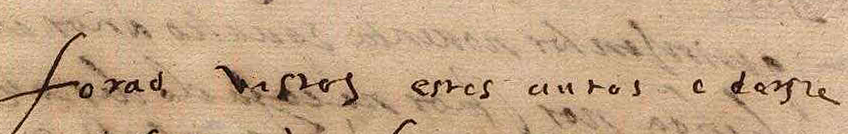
foraõ vistos estes autos e teste
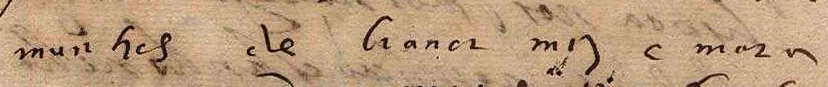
munhas de lianor miz e mara
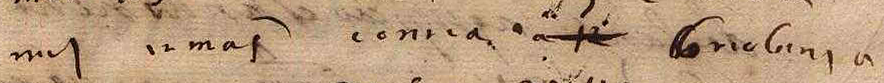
miz irmas̄ contra a R briolanja
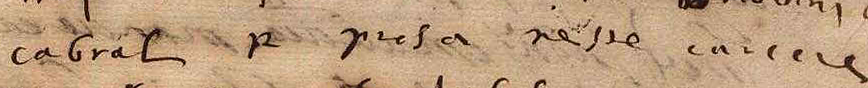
cabraL R presa neste carcere
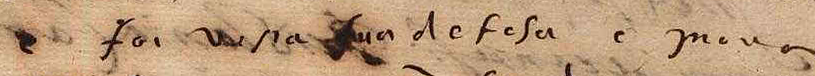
e foi vista sua defesa e proua
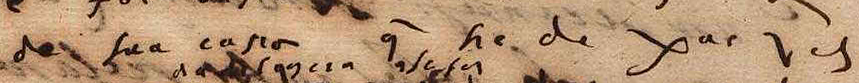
d_ sua casta q̄ he de Xas Vas
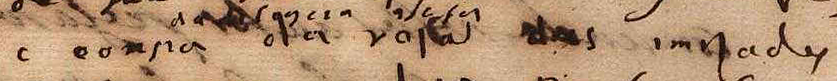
e consta o ter rasaõ das imizades
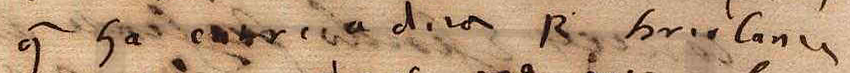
q̄ ha contra a dita R briolania
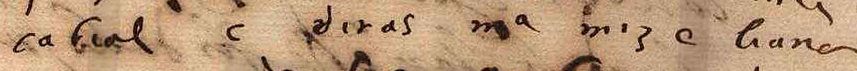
cabral e ditas ma miz e lianor
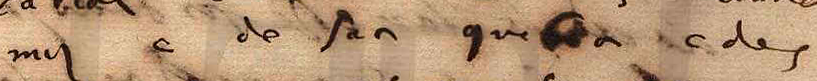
miz e de sua queb_a e des
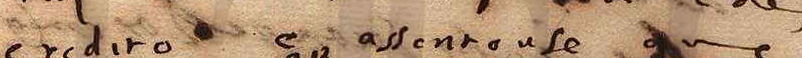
credito e assentouse que
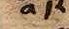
a R
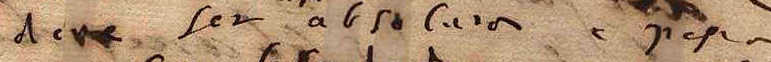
deue ser absoluta e posta
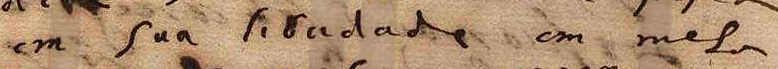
em sua liberdade em mesa
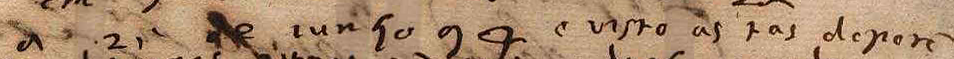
a 21 de iunho 94 e visto as tas deporē
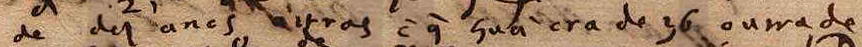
de dez anos atras ē q̄ huā era de 16 outra de 11
